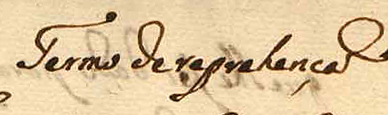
Termo de reprehençaõ
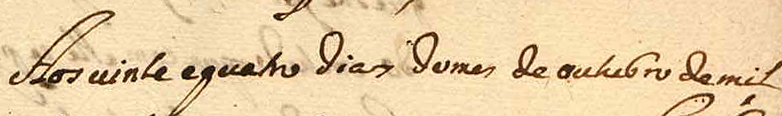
Aos uinte e quatro dias do mes de outubro de mil
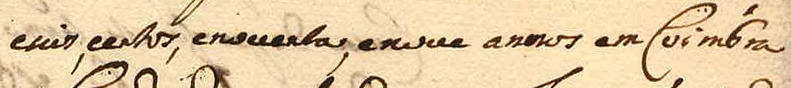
e seiscentos, e nouenta, e noue annos em Coimbra
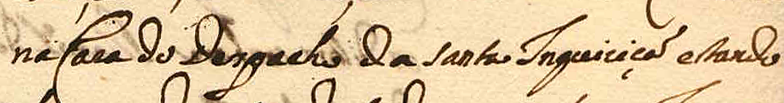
na Caza do Despacho da santa Inquiziçaõ estando
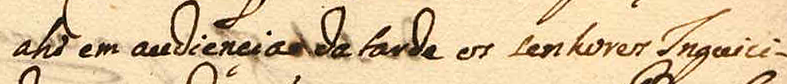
ahi em audiencia da tarde os senhores Inquizi
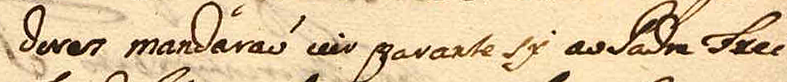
dores mandaraõ uir parante sy ao Padre Frei
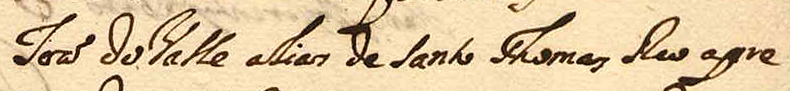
Ioaõ do Valle alias de santo Thomas Reo apre
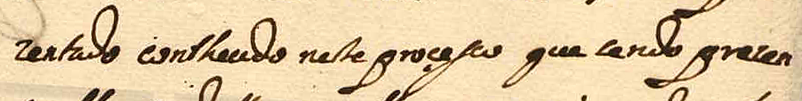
zentado contheudo neste processo que cendo prezen
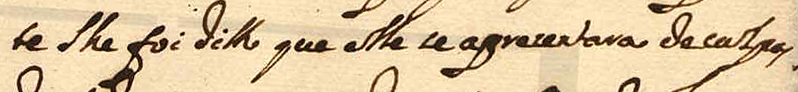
te lhe foi ditto que elle se aprezentara de culpas
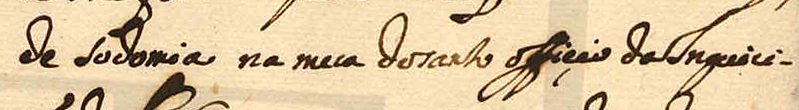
de sodomia na mesa do santo officio da Inquizi
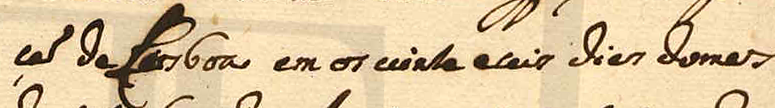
çaõ de Lisboa em os uinte e ceis dias do mes
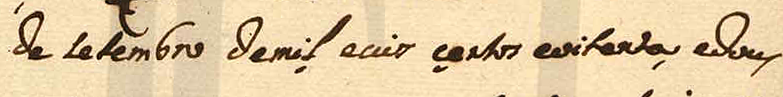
de setembro de mil e ceiscentos e oitenta, e dous
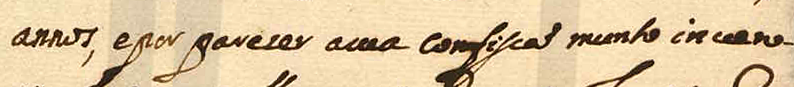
annos, e por parecer a sua confissaõ munto inuero
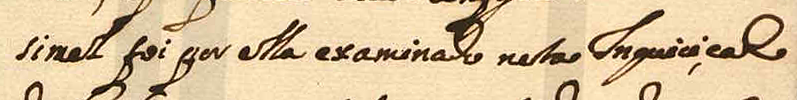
simel foi por ella examinado nesta Inquisiçaõ
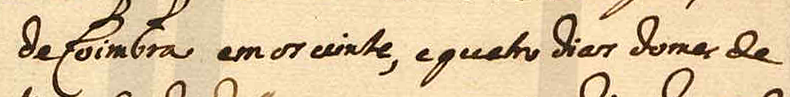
de Coimbra em os uinte, e quatro dias do mes de
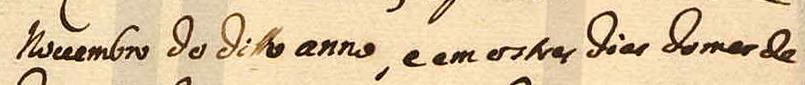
Nouembro do ditto anno, e em os tres dias do mes de
